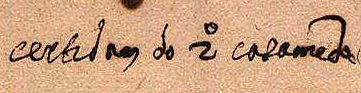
certidam do 2o casamēto
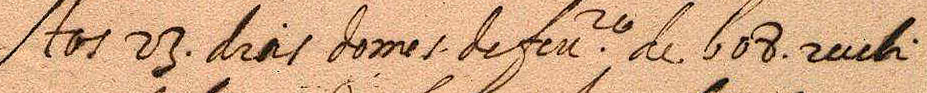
Aos 23. dias do mes. de feu.ro de 608. recebi
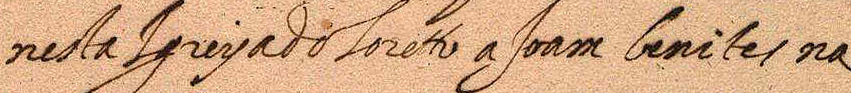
nesta Igreja do Loretto a Joam benites na
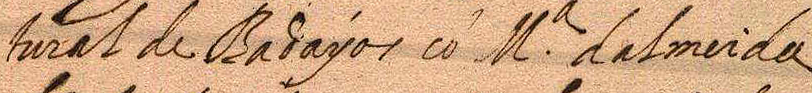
tural de Badayoz cō M.a dalmeida
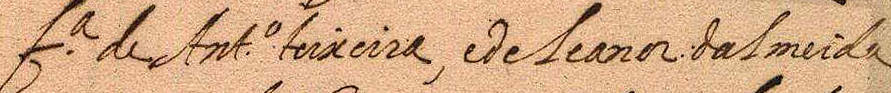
f.a de Ant.o teixeira, e de leanor dalmeida
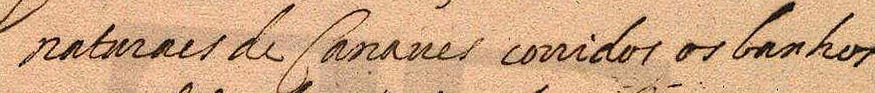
naturaes de Canaues corridos os banhos
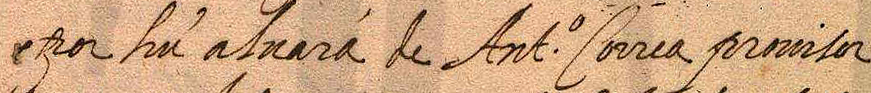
e por hū aluará de Ant.o Correa prouisor
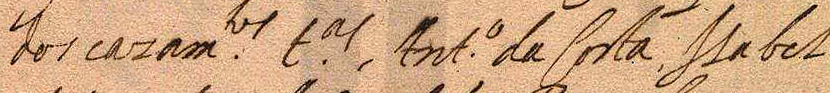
dos cazam.tos t.as, Ant.o da Costa, Jzabel
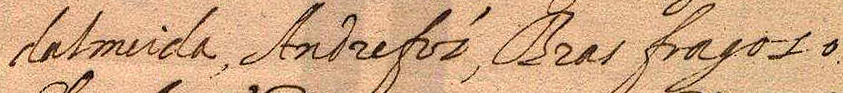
dalmeida, Andre frz̄, Bras fragozo
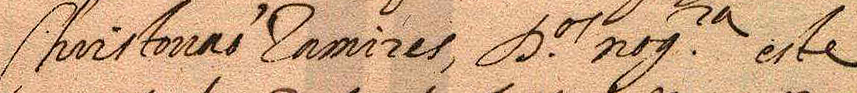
Christouaõ Ramires, D.os nog.ra este
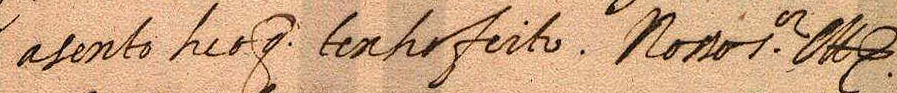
asento he o q̄ tenho feito. Nosso s.or ettcꝭ.
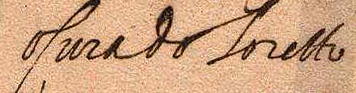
o Cura do Loretto
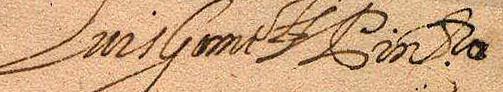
Luis Gomclz Pinh.ro
